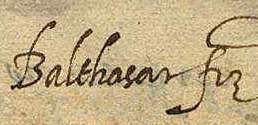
Balthasar frz̄
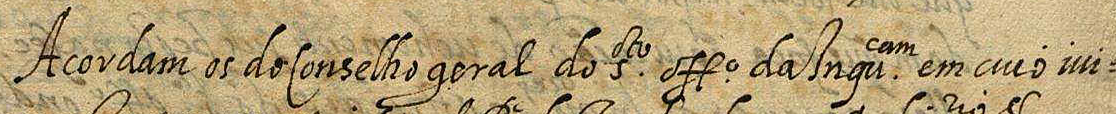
Acordam os do Conselho geral do scto. off.o da Inqu.çam em cuio iui
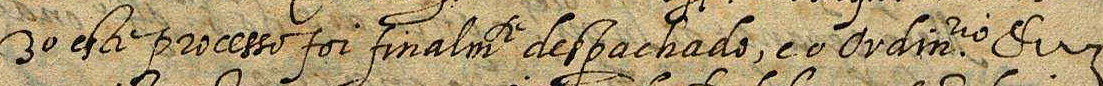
zo este processo foi finalmte despachado, e o ordin.rio &
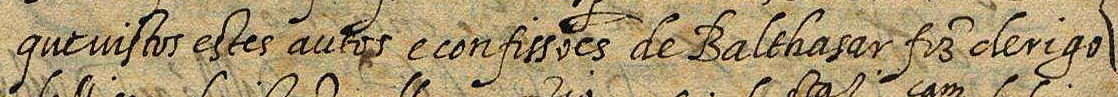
que uistos estes autos e confissões de Balthasar frz̄ clerigo
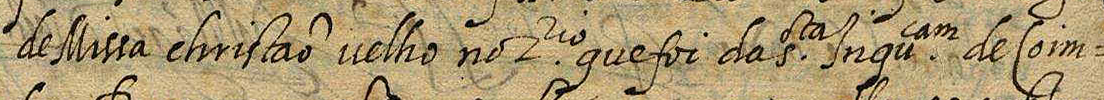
de Missa christaõ uelho not.rio que foi da s.cta Inqu.çam de Coim
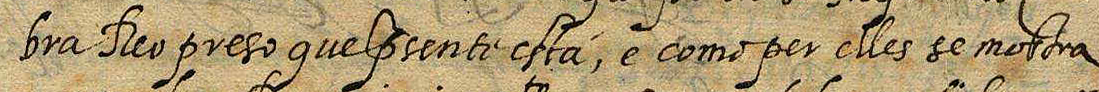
bra Reo preso que p̄sente está, e como per elles se mostra
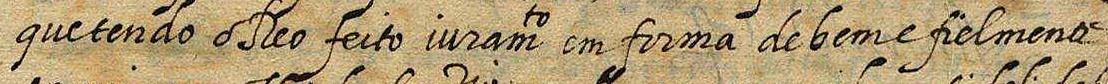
que tendo o Reo feito iuramto em forma de bem e fielmente
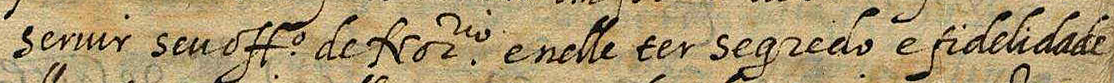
seruir seu off.o de Notrio. e nelle ter segredo e fidelidade
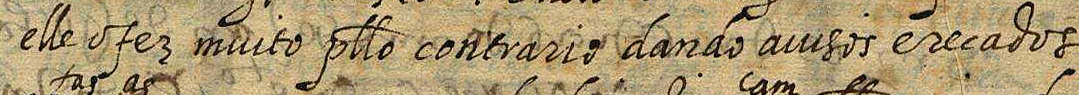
elle o fez muito p̄llo contrario dando auisos e recados
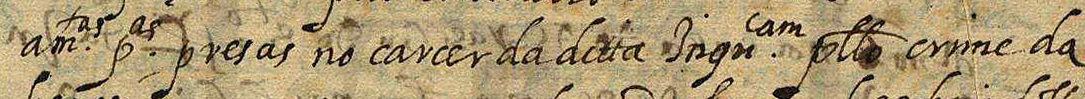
a mtas. pas. presas no carcer da ditta Inqu.çam p̄llo crime da
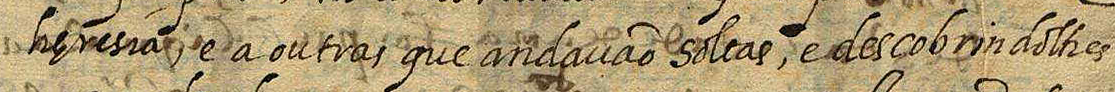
hEresia, e a outras que andauão soltas, e descobrindolhes
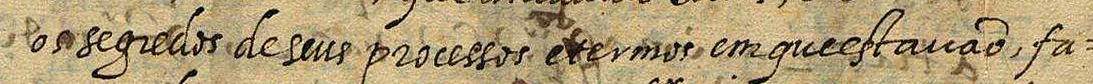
os segredos de seus processos e termos em que estauaõ, fa
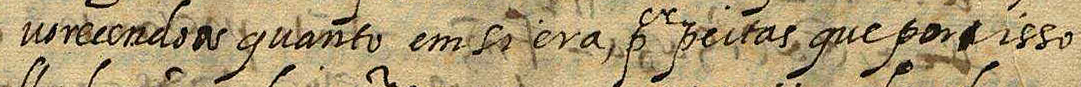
uorecendo as quanto em si era, por peitas que por isso
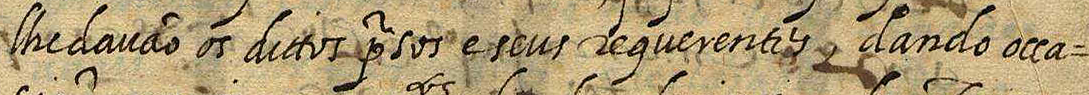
lhe dauão os dittos p̄sos e seus requerentes, dando occa
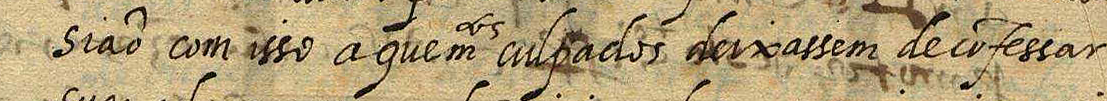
siaõ com isso a que mtos culpados deixassem de cōfessar
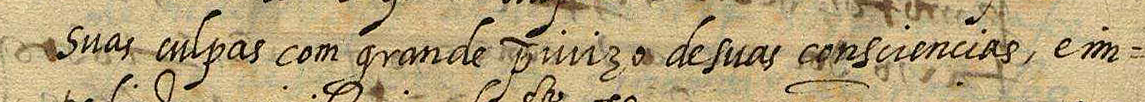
suas culpas com grande p̄iuizo de suas consciencias, e im
